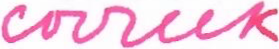сычик
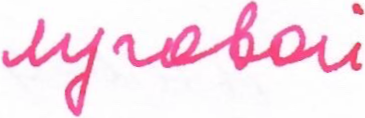луговой
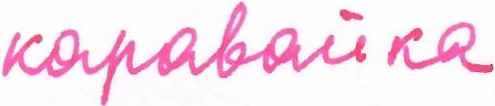каравайка
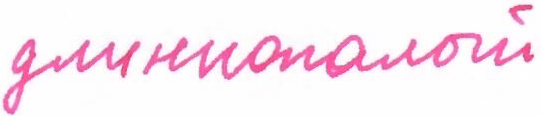длиннопалый
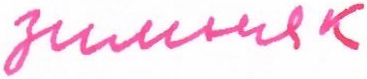зимняк
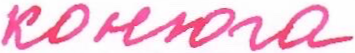конюга
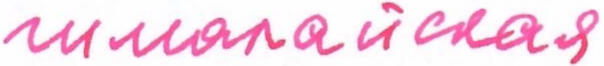гималайская
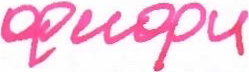фифи
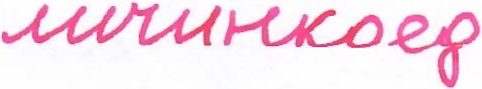личинкоед
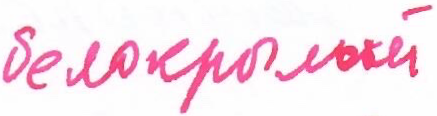белокрылый
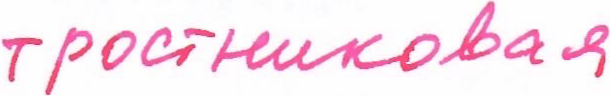тростниковая
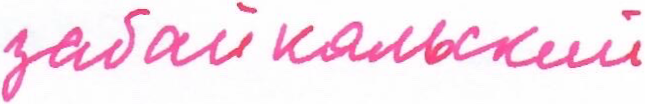забайкальский
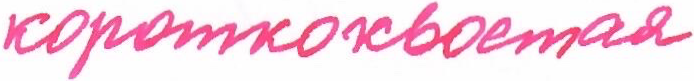короткохвостая
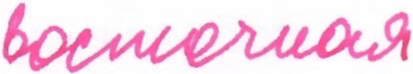восточная
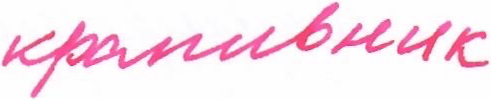крапивник
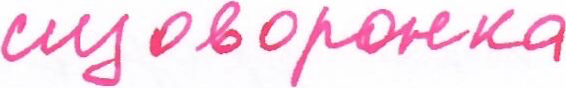сизоворонка
